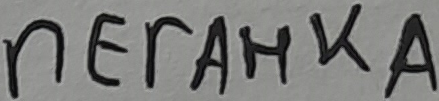пеганка
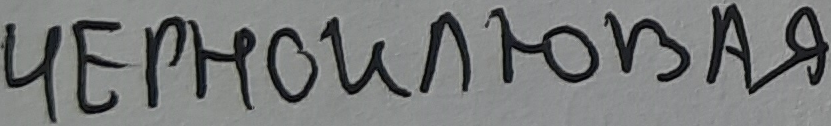черноклювая
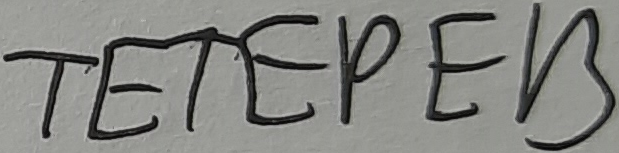тетерев
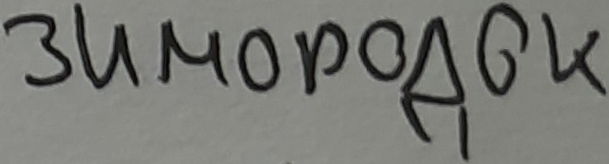зимородок
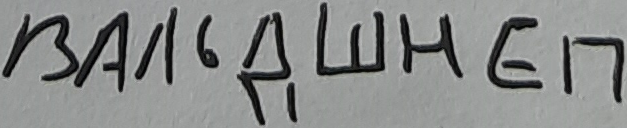вальдшнеп
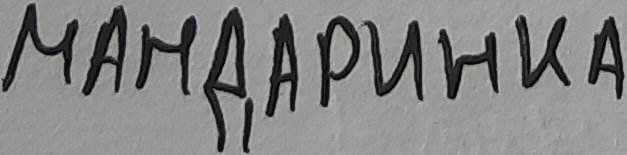мандаринка
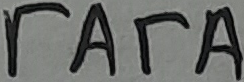гага
